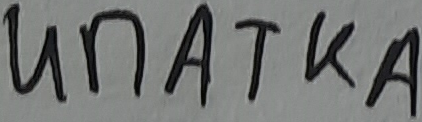ипатка
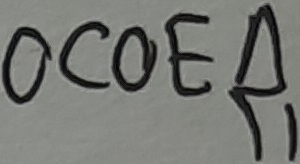осоед
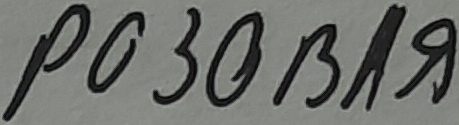розовая
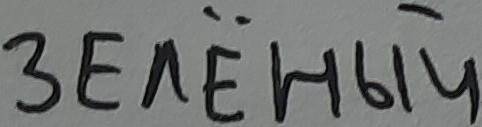зелёный
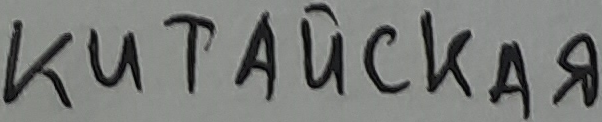китайская
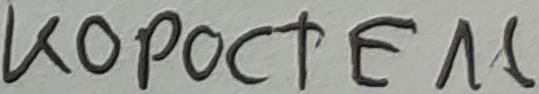коростель
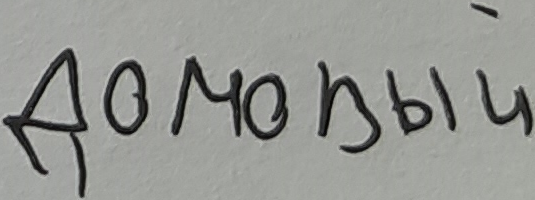домовый
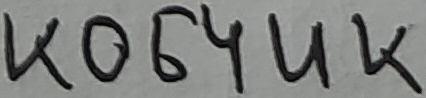кобчик
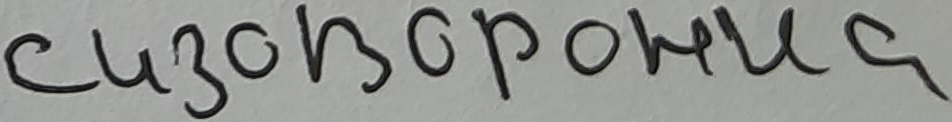сизоворонка
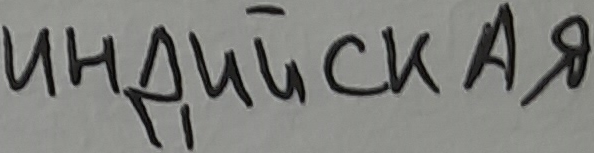индийская
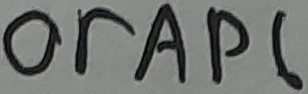огарь
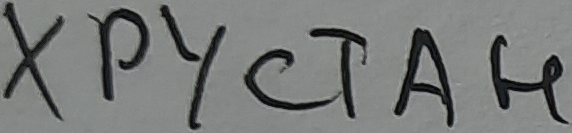хрустан
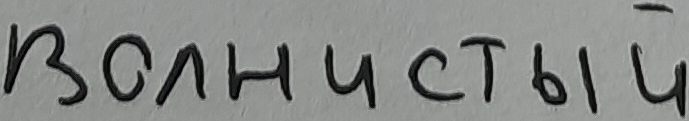волнистый
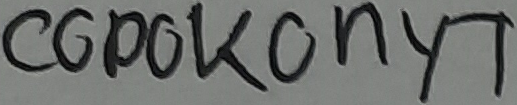сорокопут
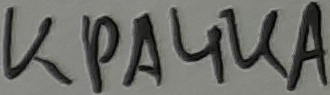крачка
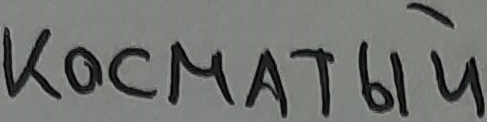косматый
